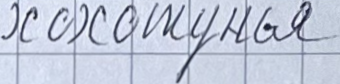хохотунья
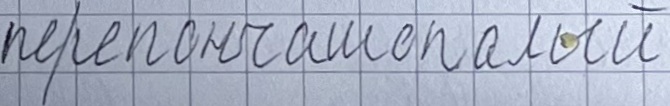перепончатопалый
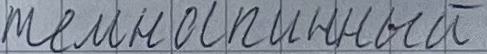темноспинный
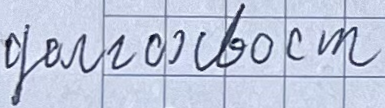долгохвост
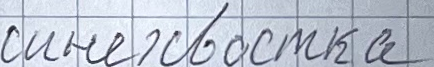синехвостка
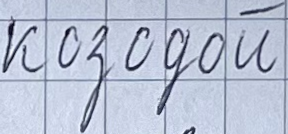козодой
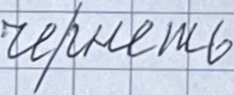чернеть
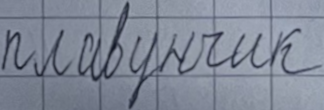плавунчик
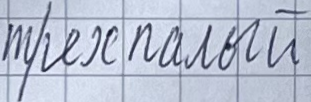трехпалый
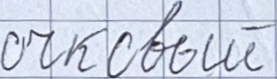очковый
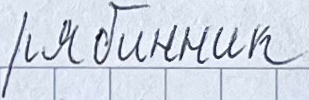рябинник
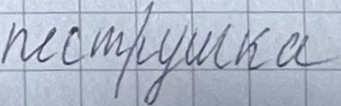пеструшка
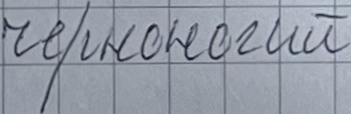черноногий
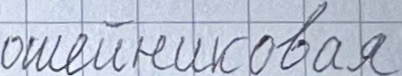ошейниковая
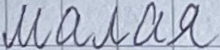малая
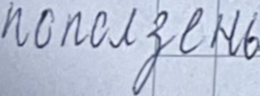поползень
